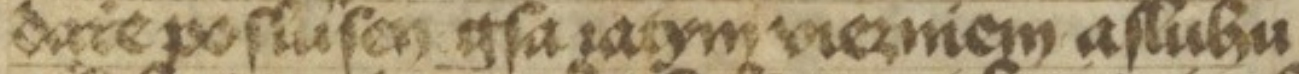daṙe poſluẛen gſa zatym viezniem a ſluhu
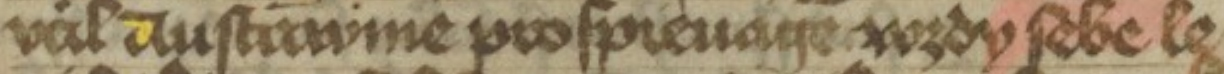vċil Auſtrawime proſpieuage wzdy ſebe le-
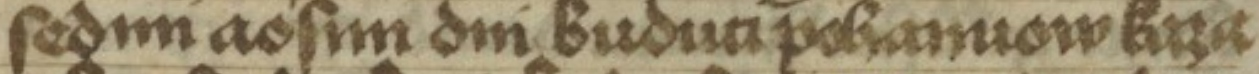ſedmi aoſm dni buduci pohanuow kaza-
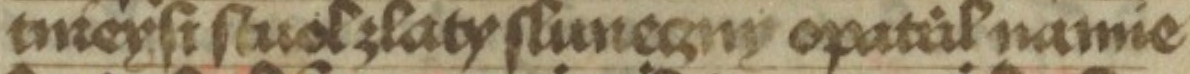tnieyẛi ſtuol zlaty ſluneczny opatṙil namie-
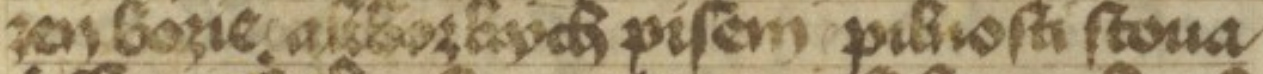zen bozie akbozkych piſem pilnoſti ſtoua-
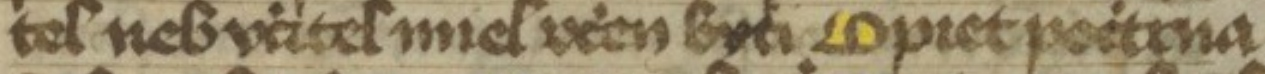tel neb vċitel miel vċen byti Opiet poċtrna-
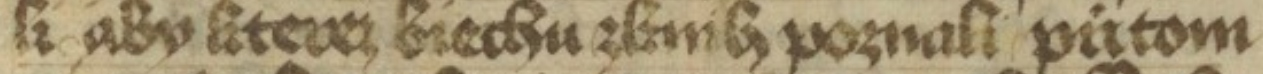li, aby kterez biechu zknih poznali pṙitom-
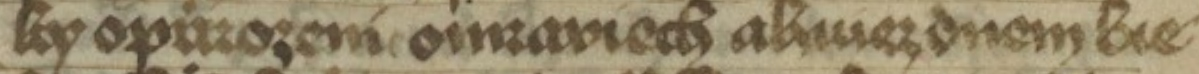ky opṙirozeni omraviech ahuiezdnem bie-
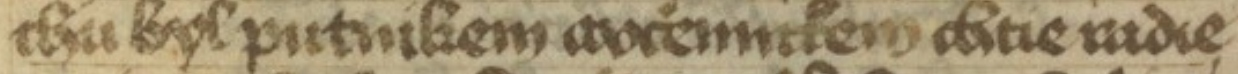chu byl putnikem avčemichem chtie radie-
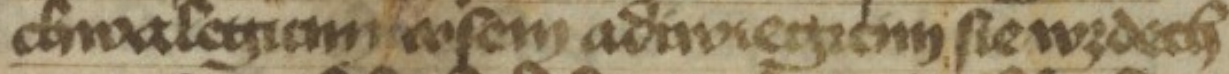chwalegicmi wẛem a diwiegicmi ſie wzdech
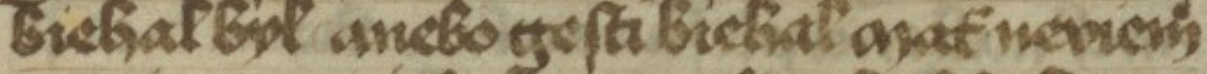biehal byl anebo geſti biehal Maṫ neviem
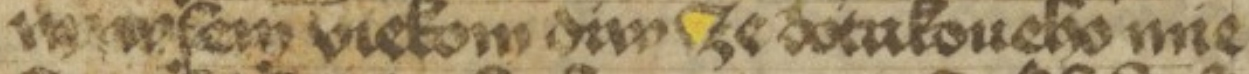ny wſem viekom diw Ze dotakoueho mie
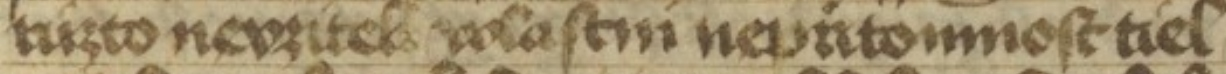ruzto nevzitek wlaſtni nepřitomnoſt tiel
